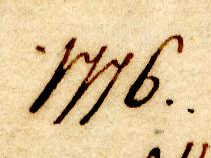1776.
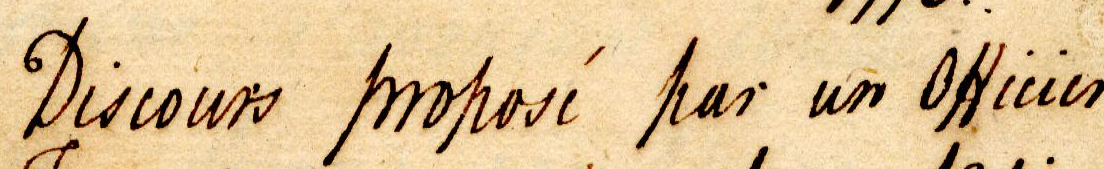Discours proposé par un Officier
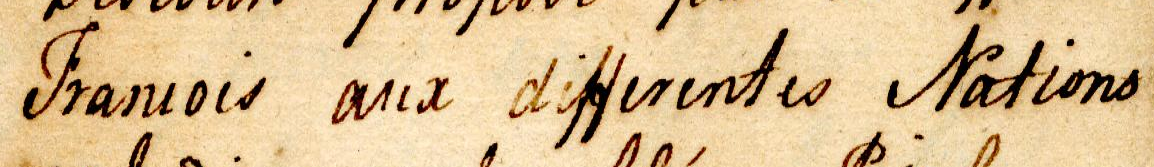Francois aux differentes Nations
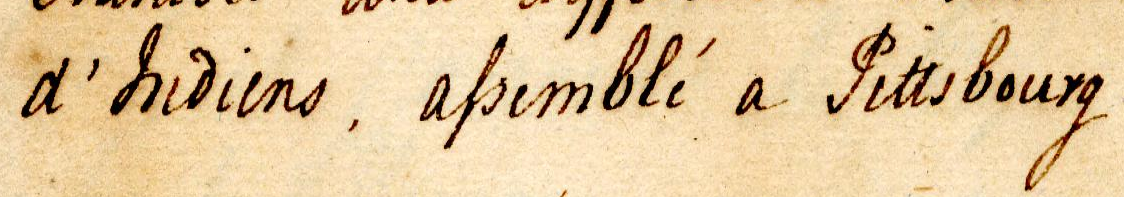d'Indiens, assemblé a Pittsbourg
